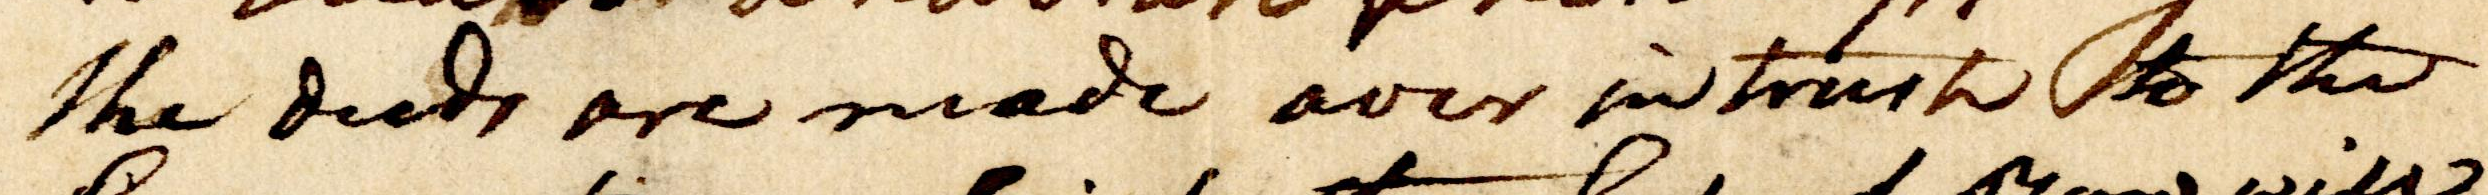the deeds are made over in trust to the
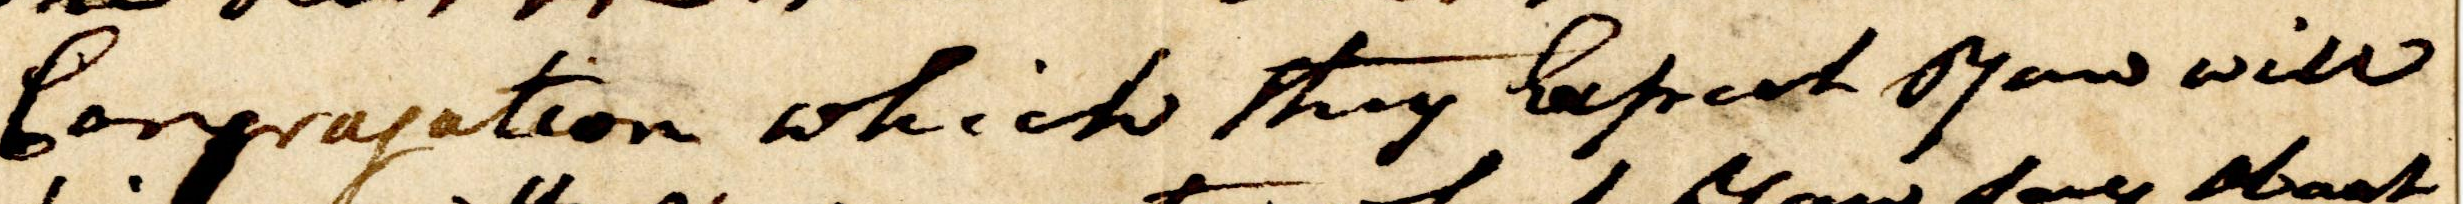Congregation which they Expect you will
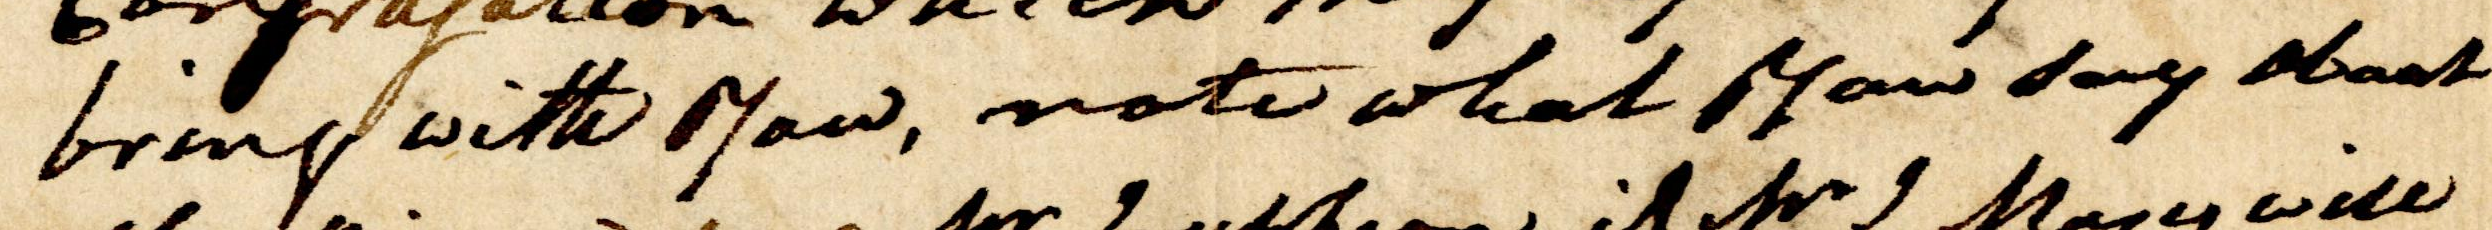bring with you, note what you say about
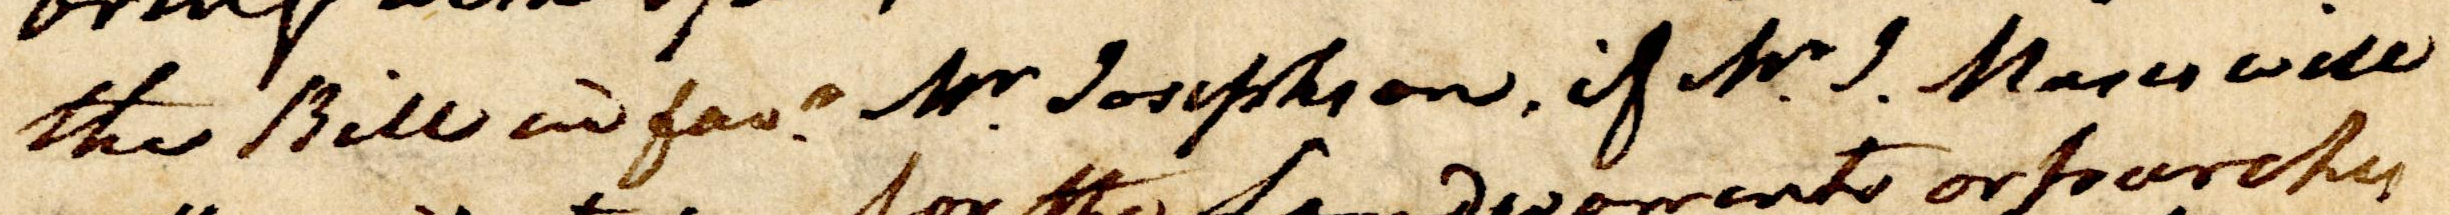the Bill in fav^r M^r. Josephson, if M^r. S. Moses will
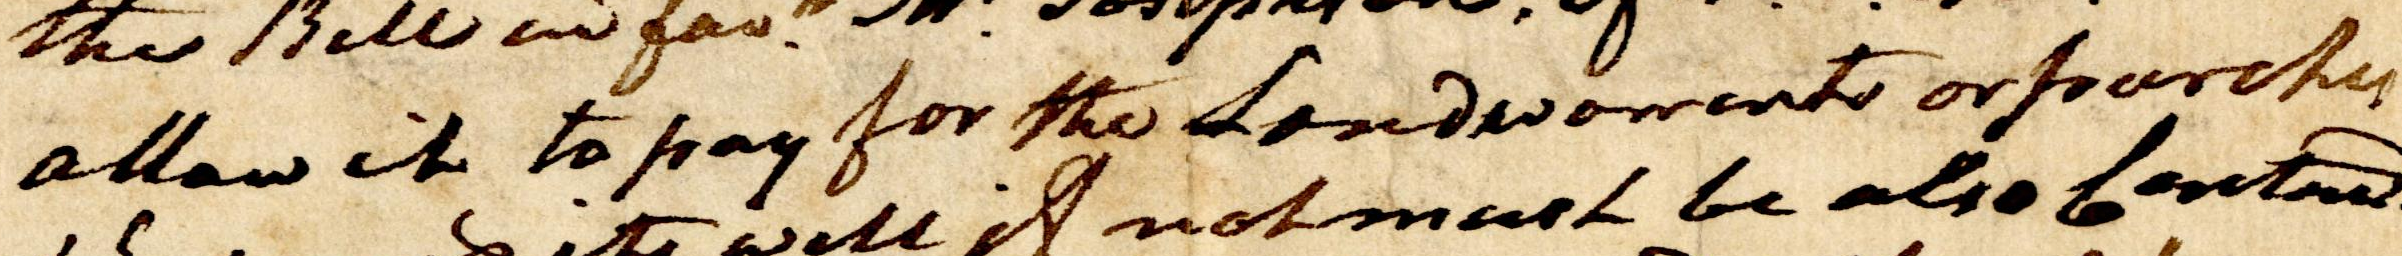allow it to pay for the Land warrants or purches
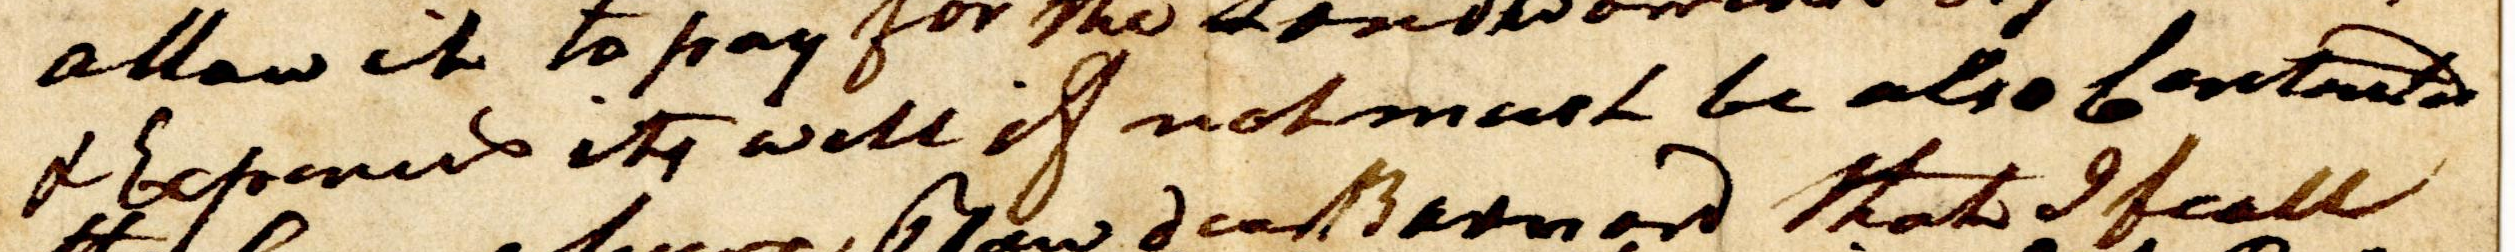& Expand it, will if not must be also Contested
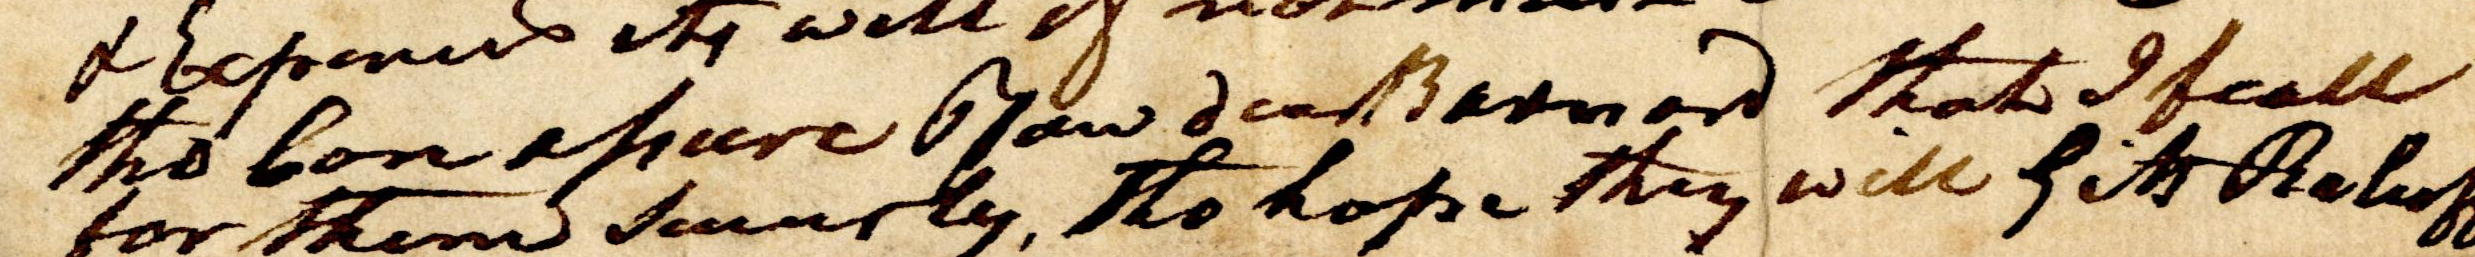tho' Can assure you dear Barnard that I shall
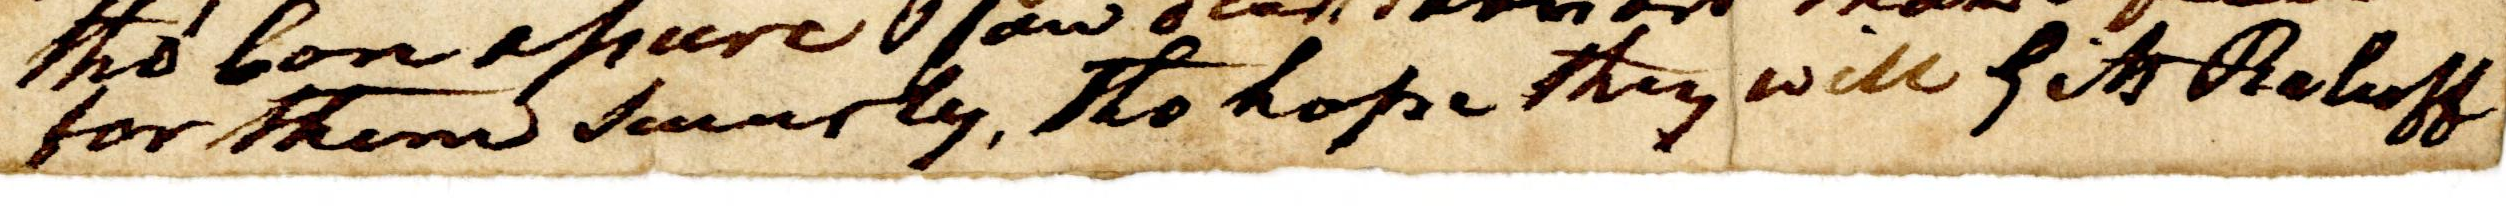for them sincerely tho hope they will Gitt Relieff
